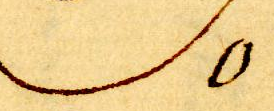To
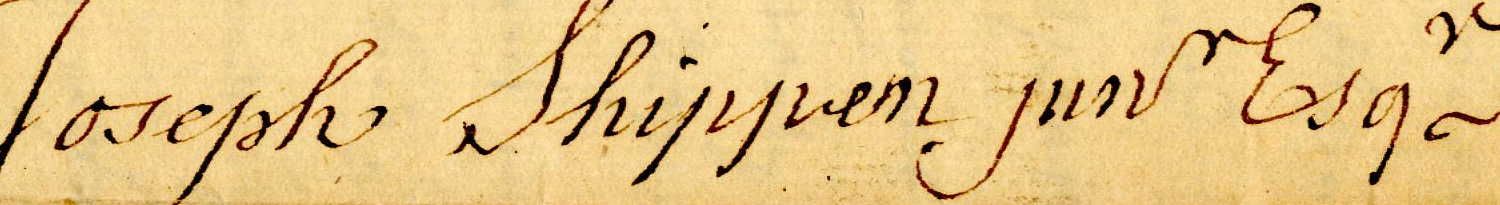Joseph Shippen jun^r Esq^r
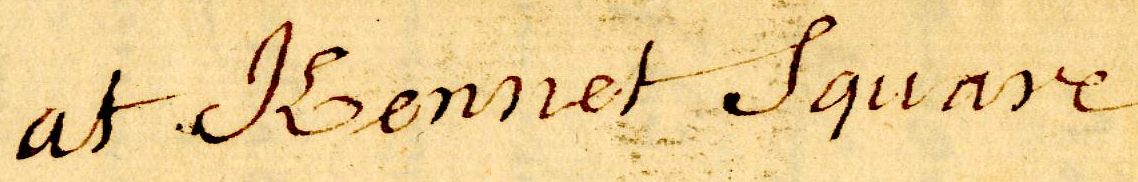at Kennet Square
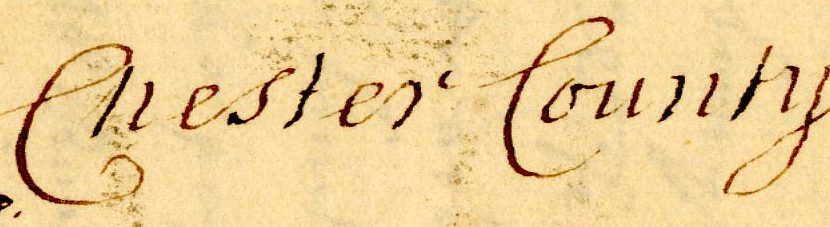Chester County
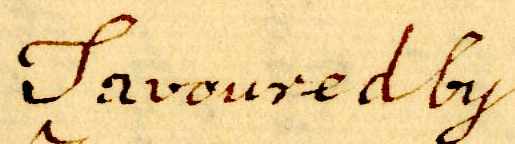Favoured by
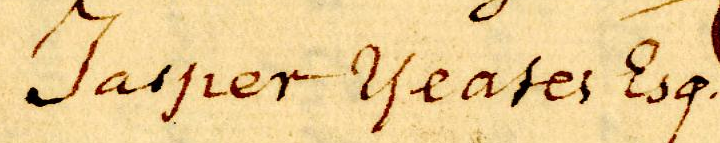Jasper Yeates Esq.
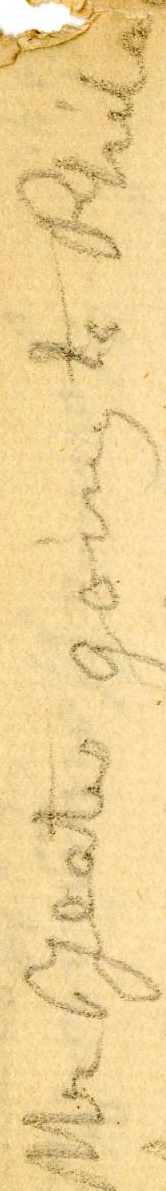Mr Yeates going to Phila.
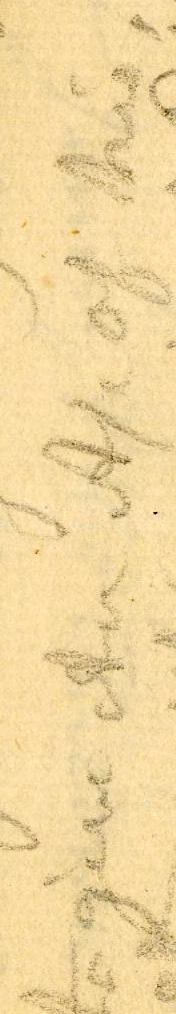to give An Acc of his,
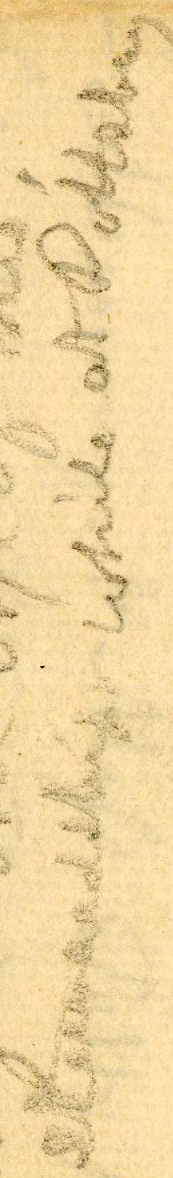stewardship while at Pittsburg
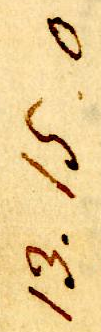13.15.0
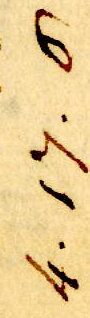4.17.6
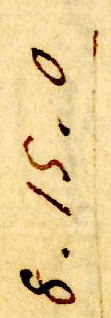8.15.0
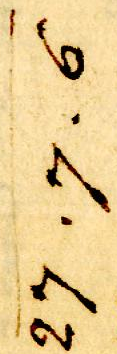27.7.6
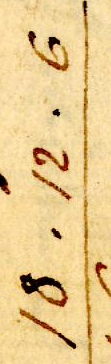18.12.6
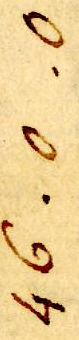46.0.0
